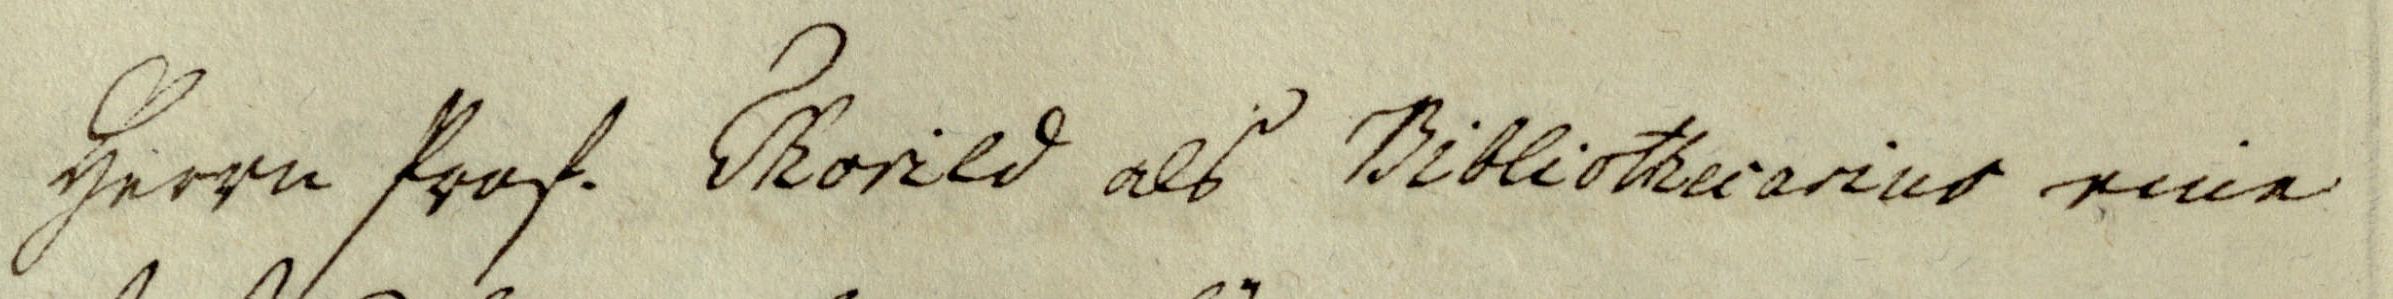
Herrn Prof. Thorild als Bibliothecarius eine
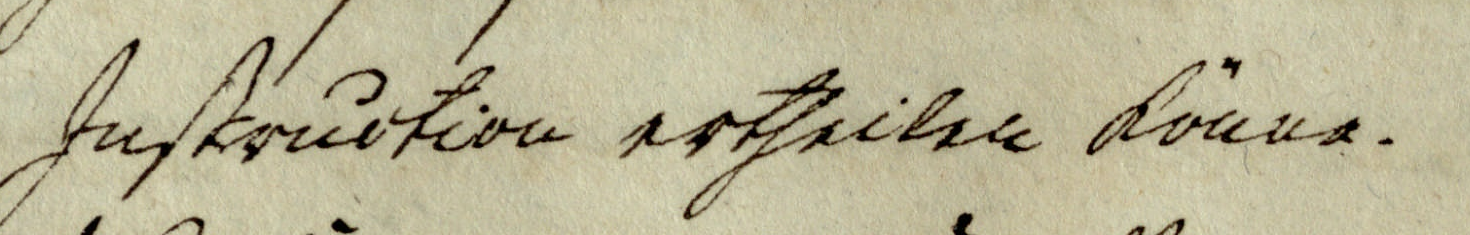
Instruction ertheilen könne.
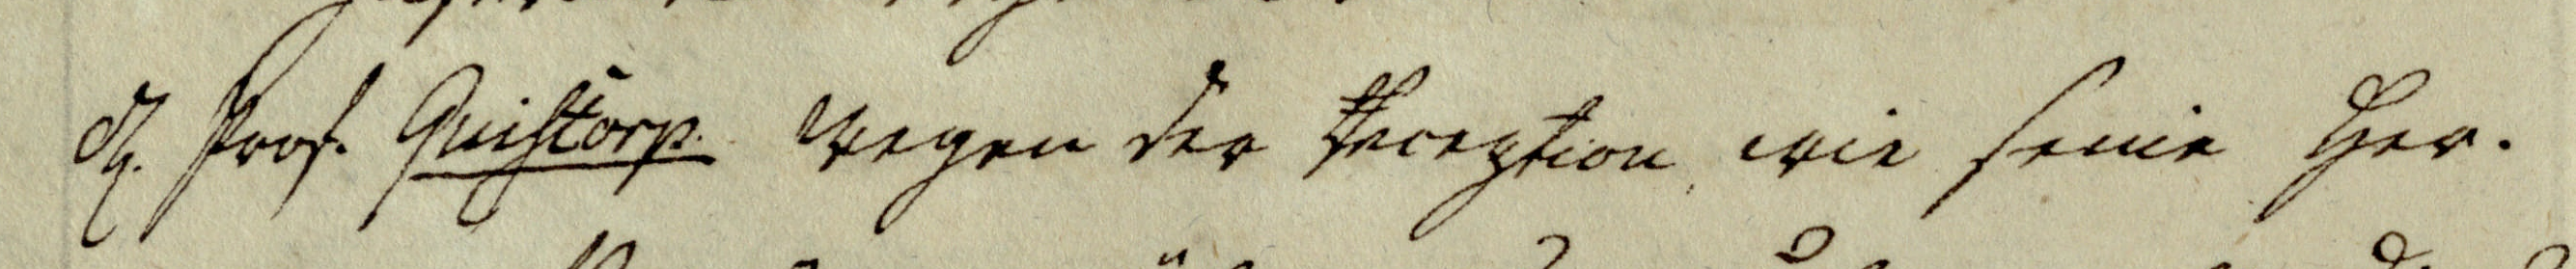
dh. Prof. Quistorp. Wegen der Reception wie seine Her¬
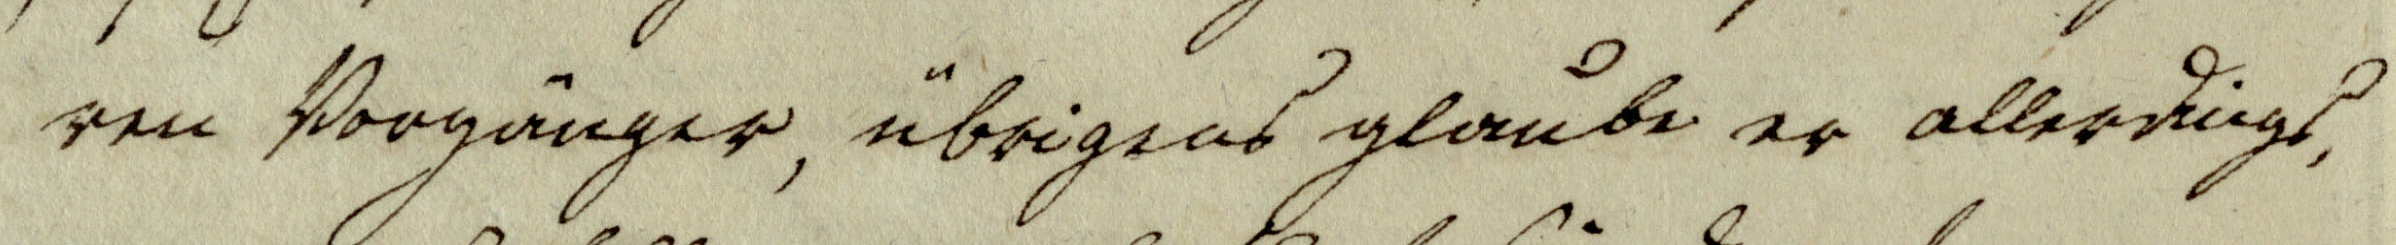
ren Vorgänger, übrigens glaube er allerdings,
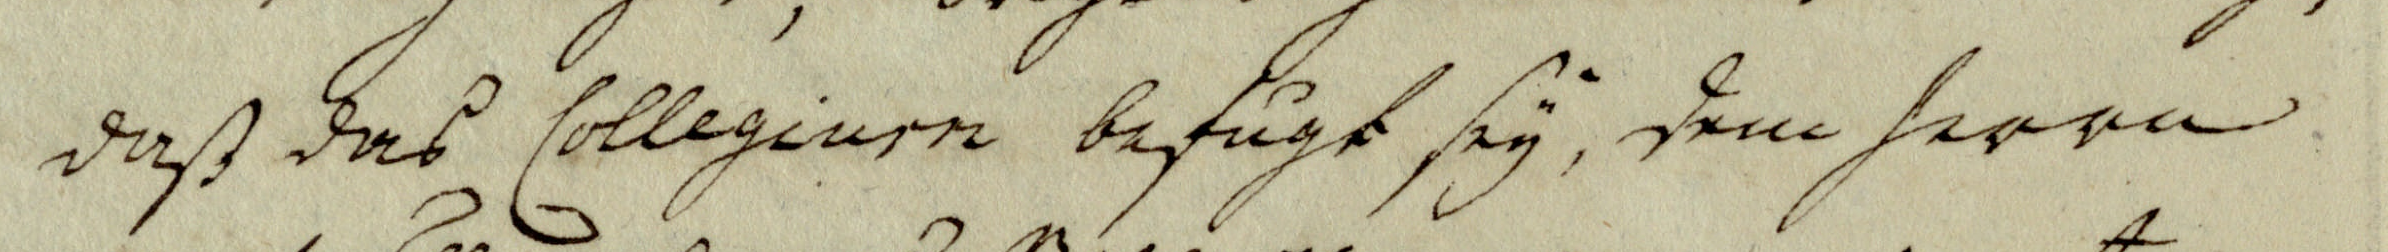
daß das Collegium befugt seÿ, dem Herrn
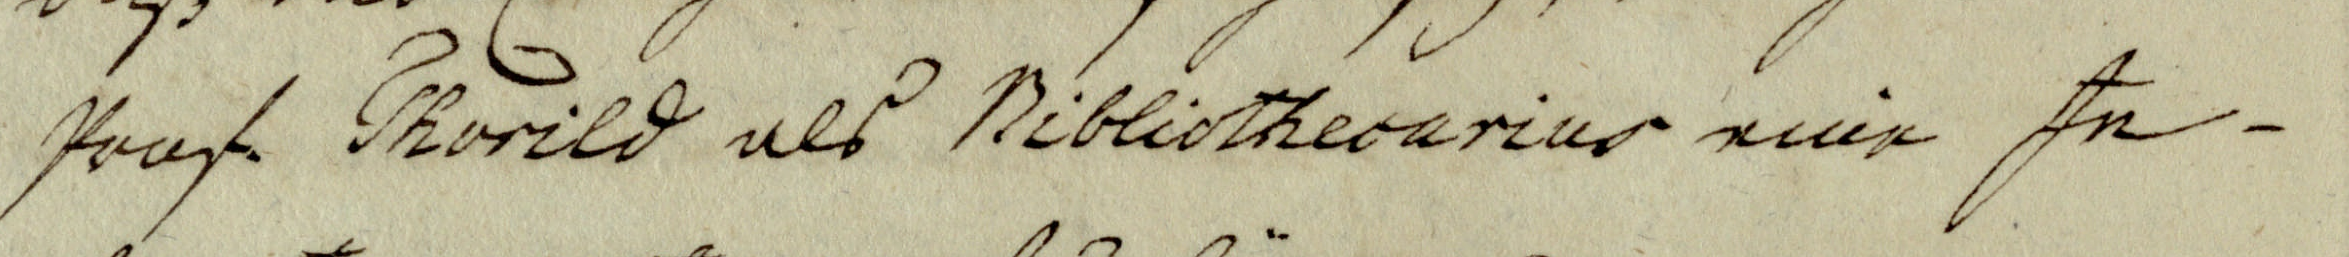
Prof. Thorild als Bibliothecarius eine In¬
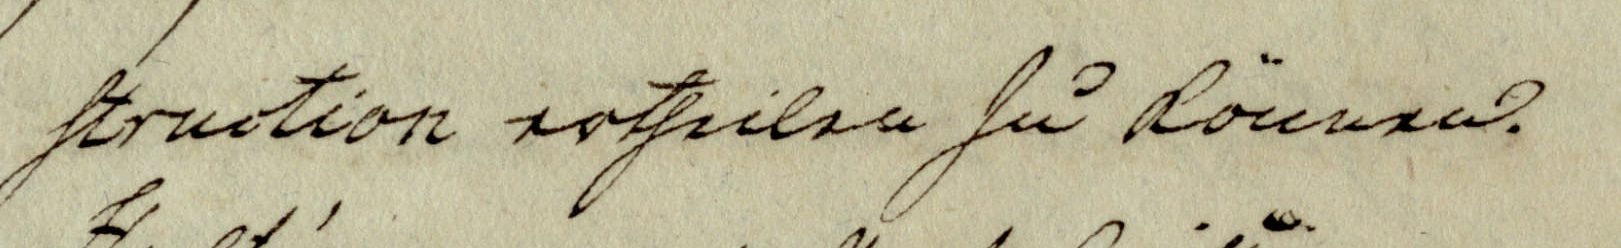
struction ertheilen zu können.
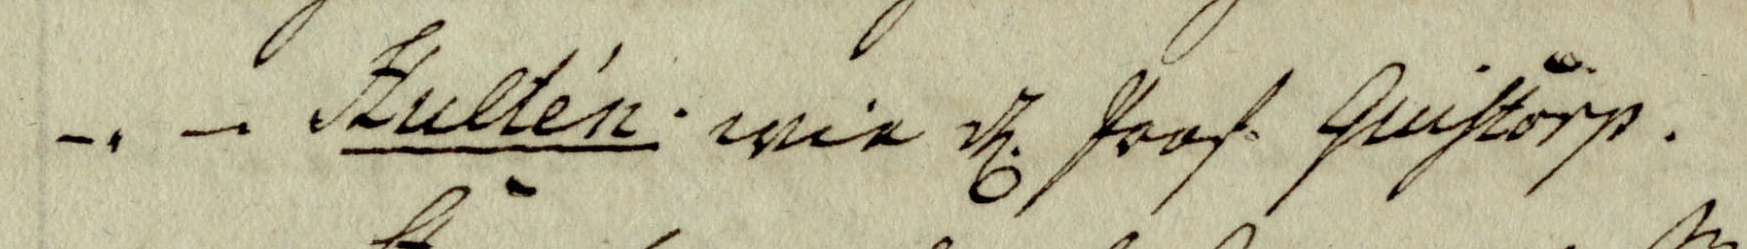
Hultén. wie dh. Prof. Quistorp.
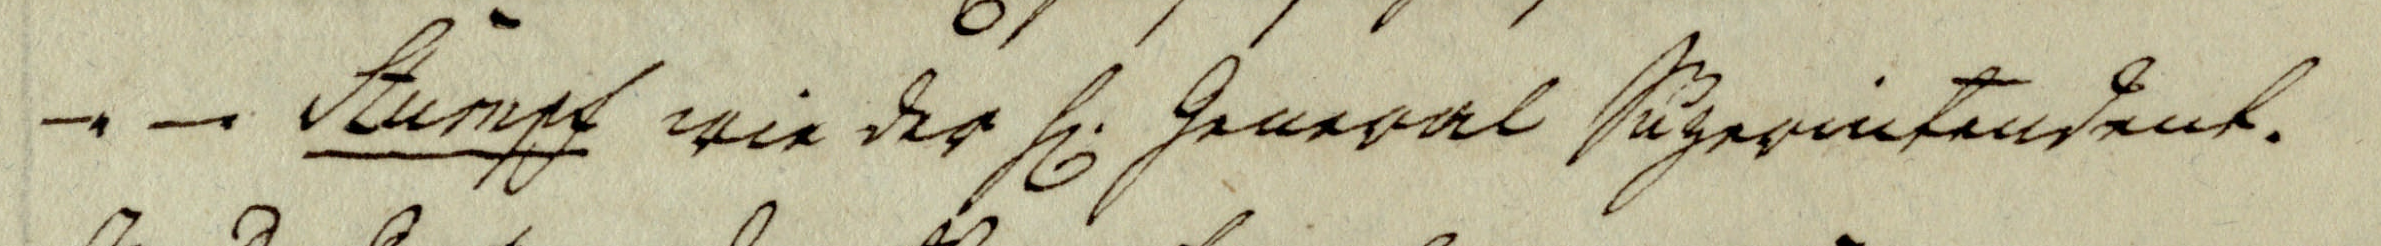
Stumpf wie der H. General Superintendent.
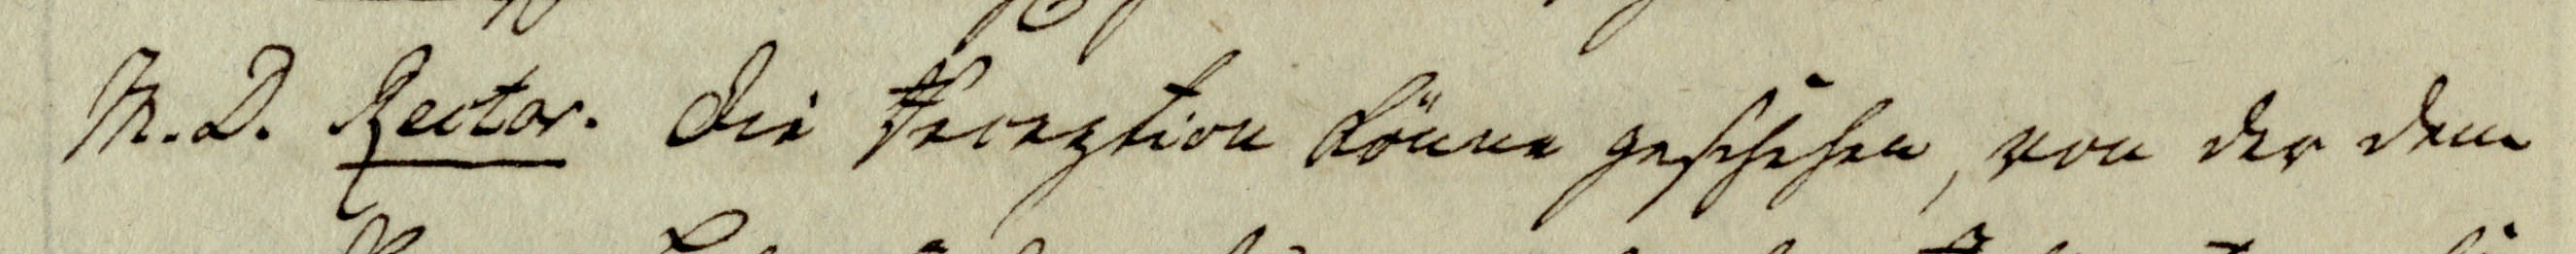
M. D. Rector. Die Reception könne geschehen, von der dem
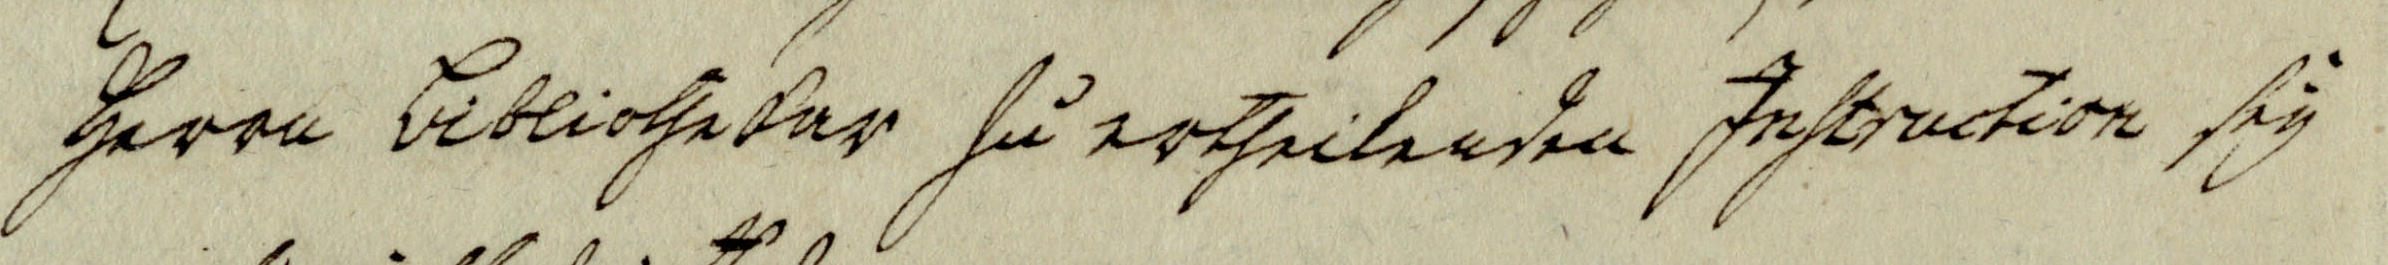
Herrn Bibliothekar zu ertheilenden Instruction seÿ
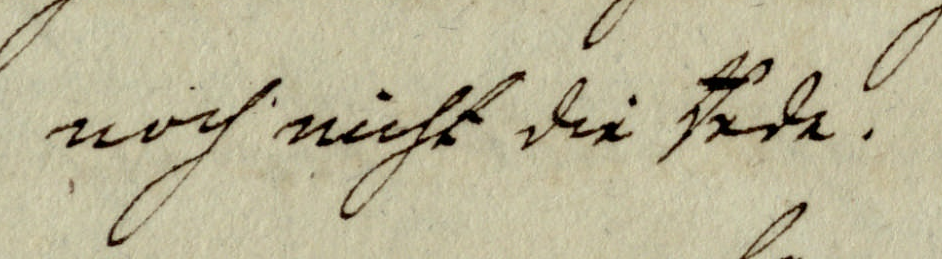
noch nicht die Rede.
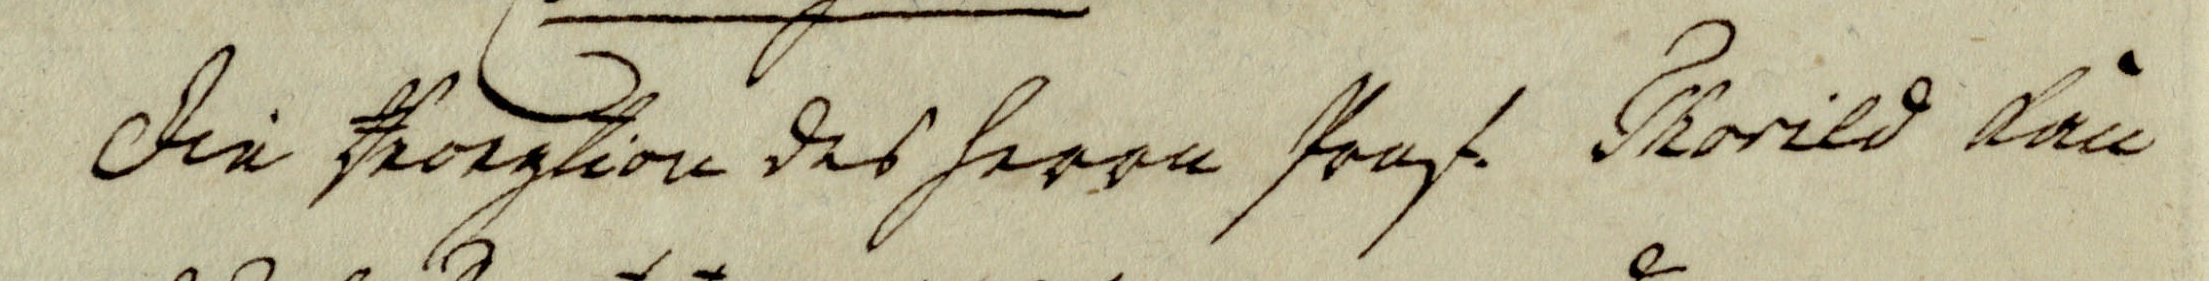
Die Reception des Herrn Prof. Thorild kan
